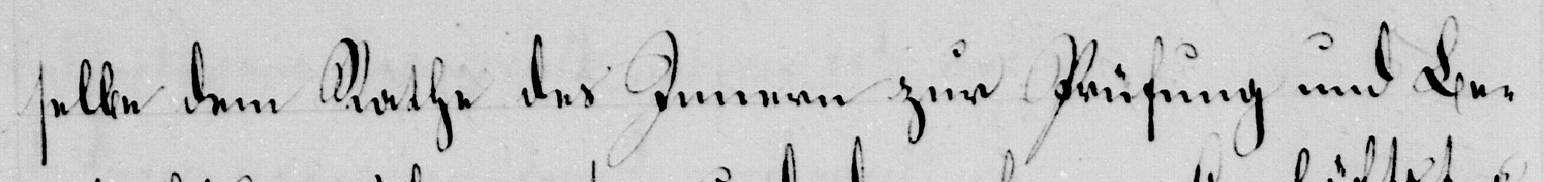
selbe dem Rathe des Innern zur Prüfung und Be¬
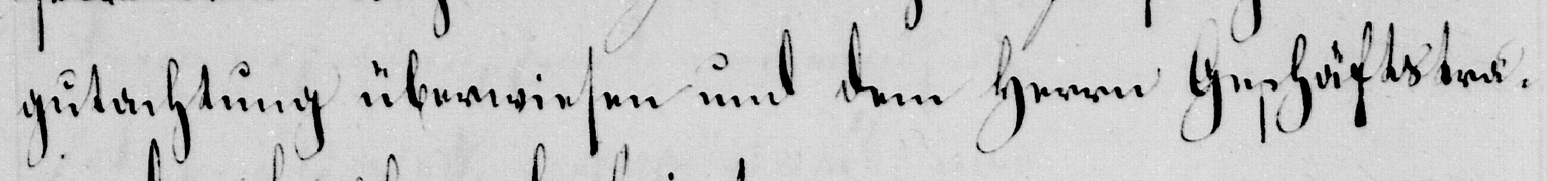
gutachtung überwiesen und dem Herrn Geschäftsträ¬
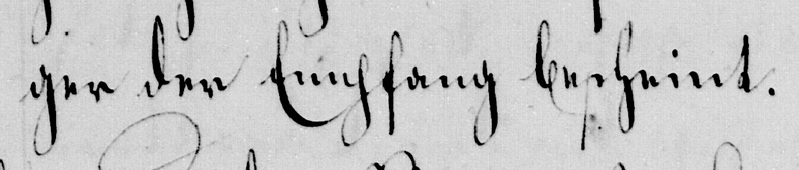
ger der Empfang bescheint.
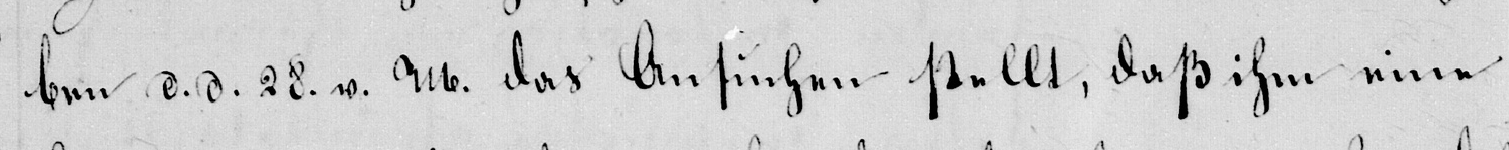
ben d. d. 28. v. M. das Ansuchen stellt, daß ihm eine
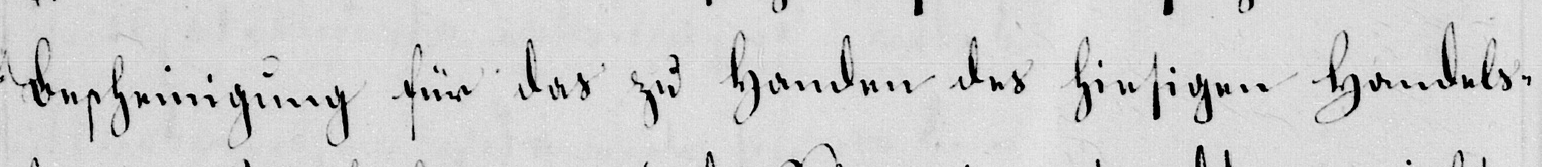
Bescheinigung für das zu Handen des hiesigen Handels¬
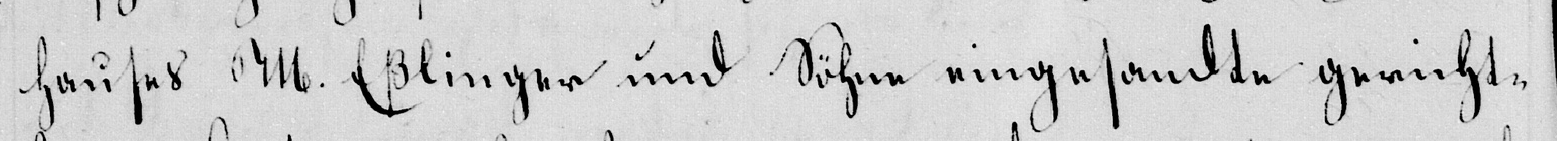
hauses M. Eßlinger und Söhne eingesandte gericht¬
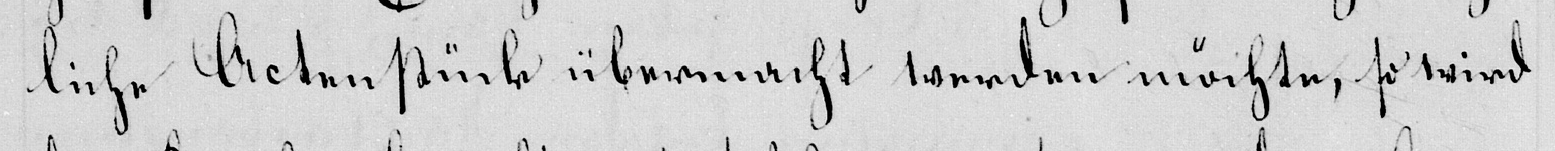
liche Actenstück übermacht werden möchte, so wird
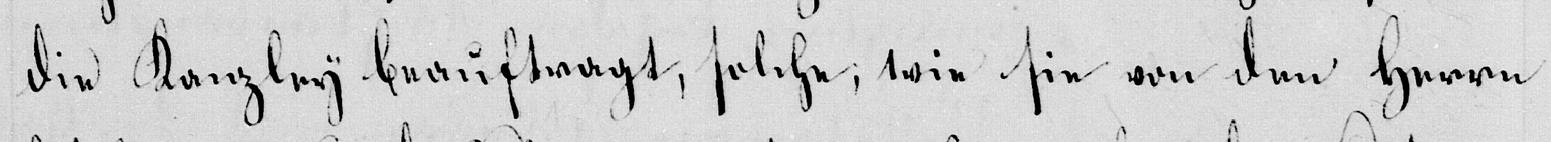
die Kanzley beauftragt, solche, wie sie von den Herrn
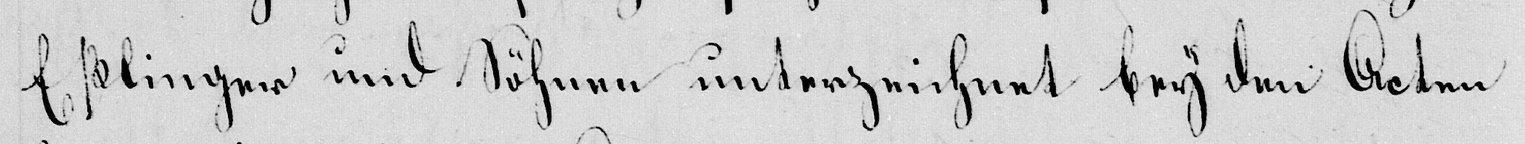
Eßlinger und Söhnen unterzeichnet bey den Acten
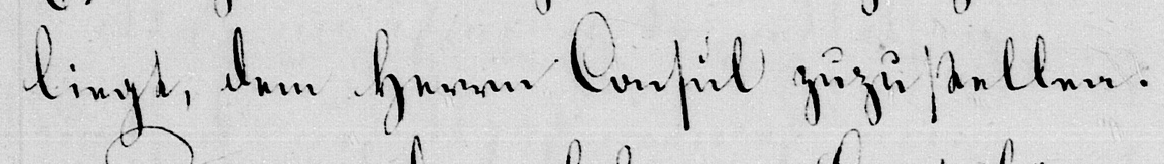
liegt, dem Herrn Consul zuzustellen.
